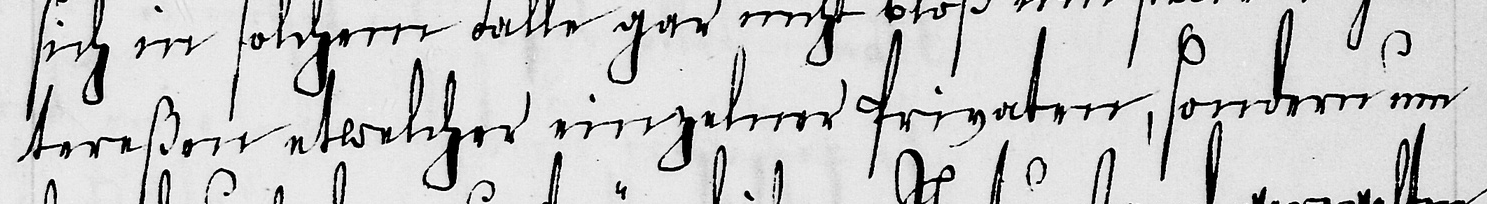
tereßen etwelcher einzelner Privaten, sondern um
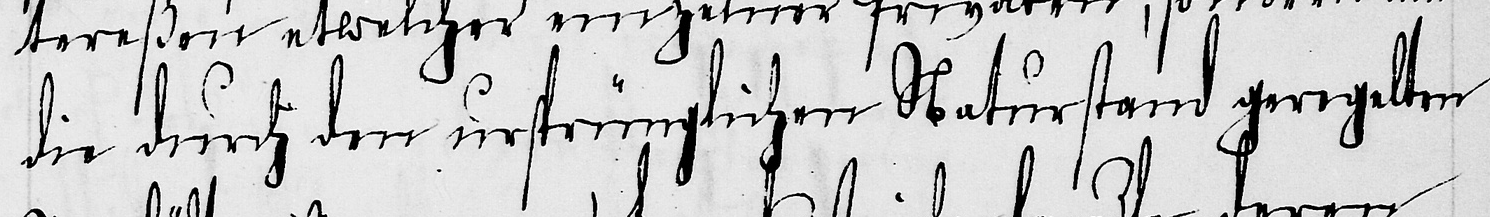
die durch den ursprünglichen Naturstand geregelten
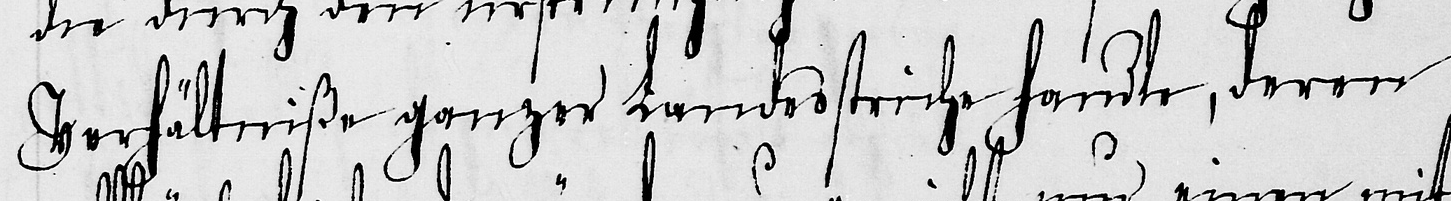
Verhältniße ganzer Landesstriche handle, deren
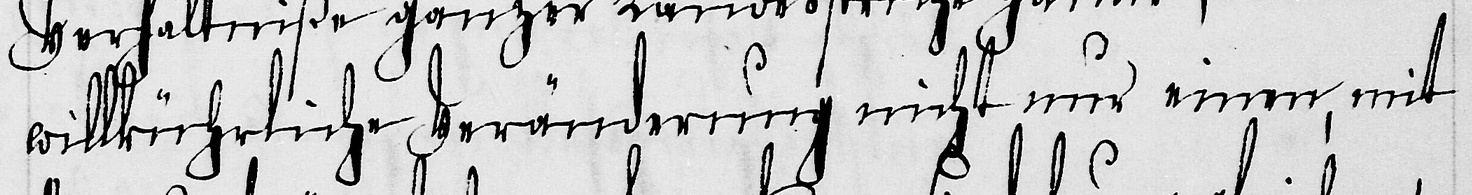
willkührliche Veränderung nicht nur einen, mit
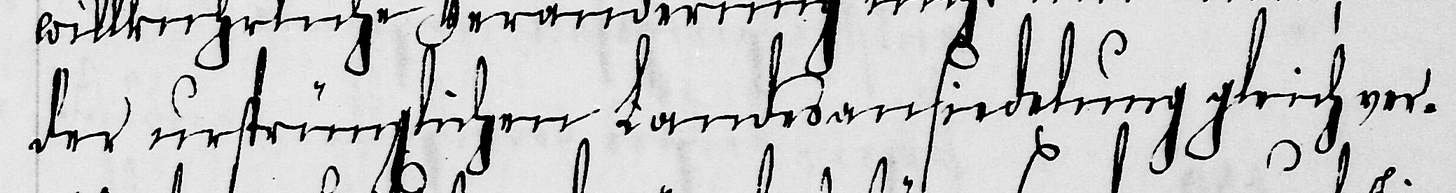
der ursprünglichen Landesansiedelung gleich ve¬
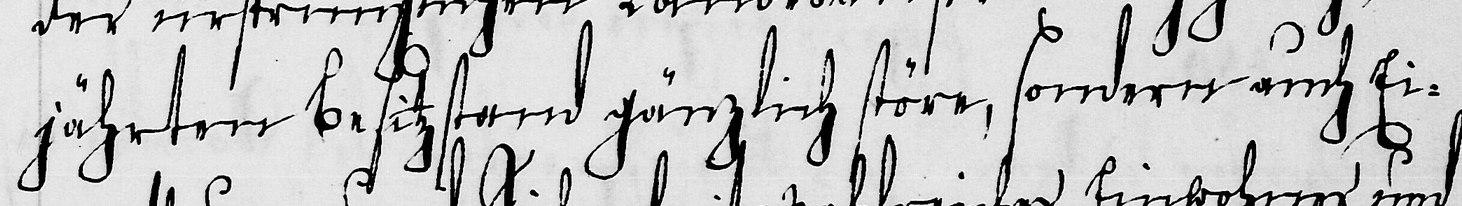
rjährten Besitzstand gänzlich störe, sondern auch Ei¬
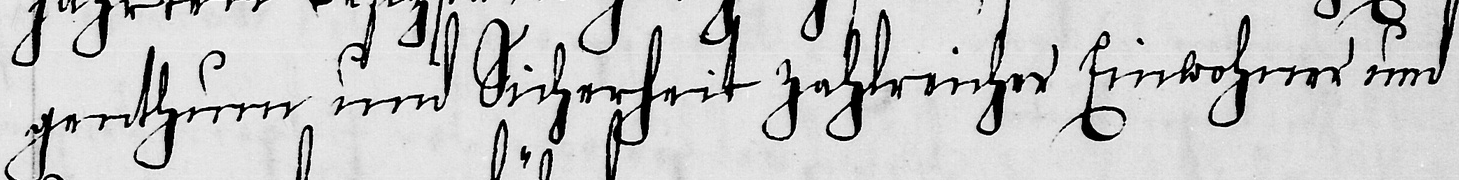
genthum und Sicherheit zahlreicher Einwohner und
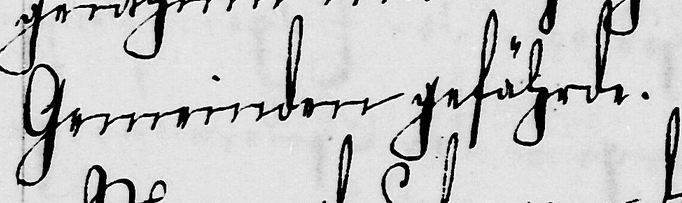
Gemeinden gefährde.
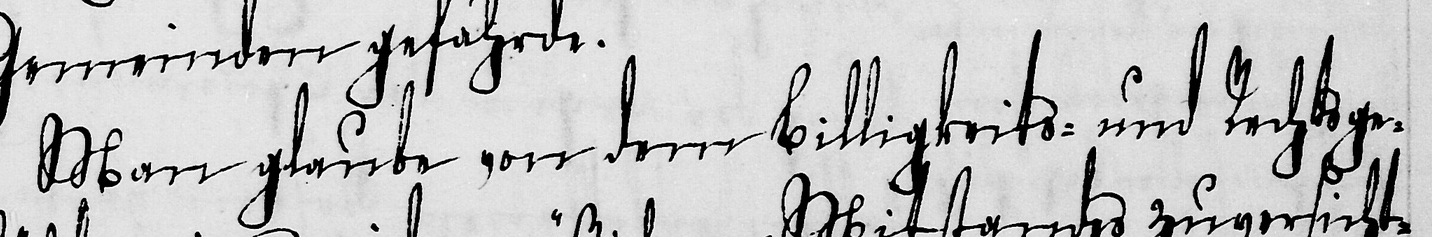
Man glaube von dem Billigkeits- und Rechtsge¬
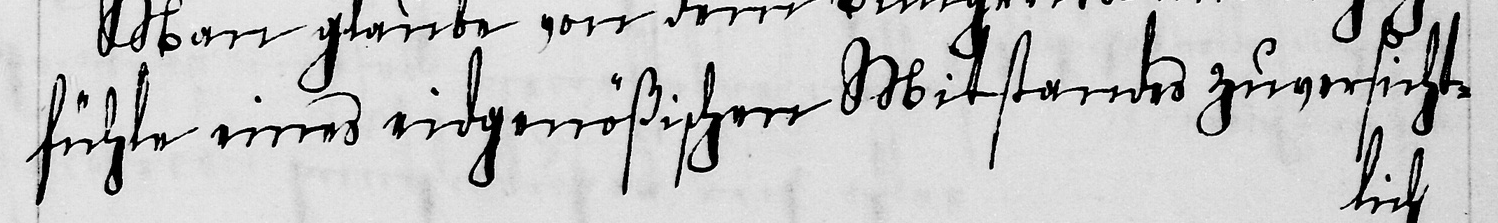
fühle eines eidgenößischen Mitstandes zuversicht-
